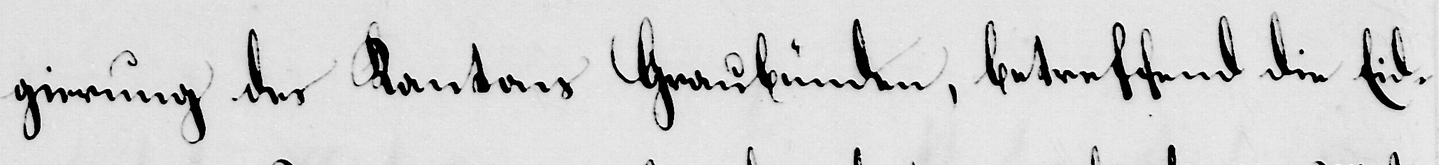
gierung des Kantons Graubünden, betreffend die Eid¬
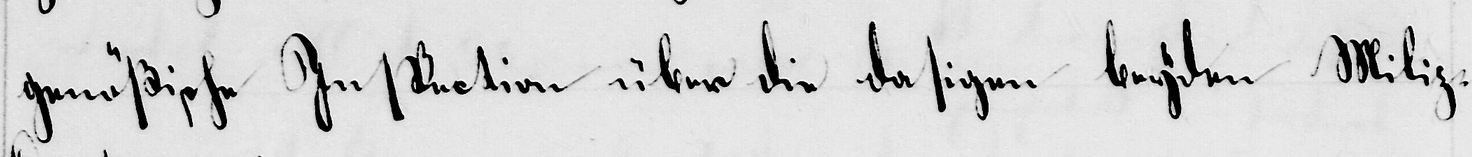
genößische Inspection über die dasigen beyden Mili¬
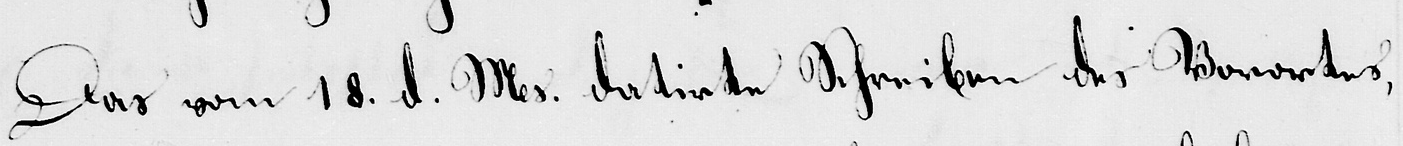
Das vom 18. d. Ms. datirte Schreiben des Vorortes,
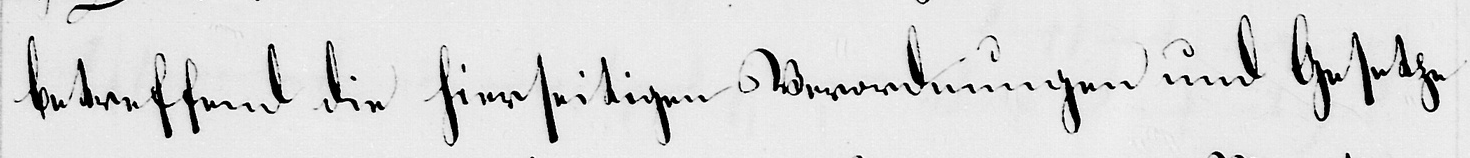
betreffend die hierseitigen Verordnungen und Gesetze
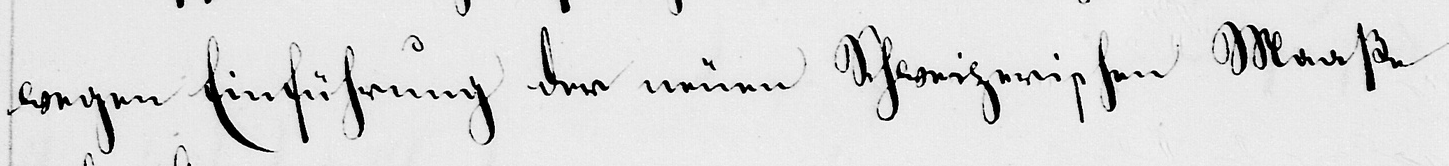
wegen Einführung der neuen Schweizerischen Maaße
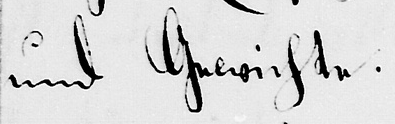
und Gewichte.
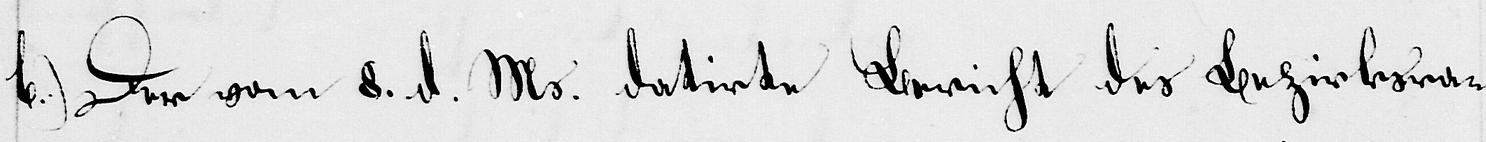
b.) Der vom 8. d. Ms. datirte Bericht des Bezirksra¬
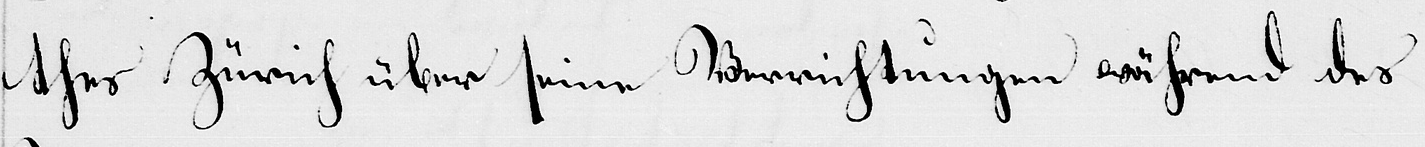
thes Zürich über seine Verrichtungen während des
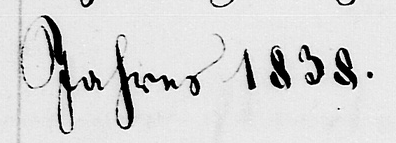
Jahres 1838.
